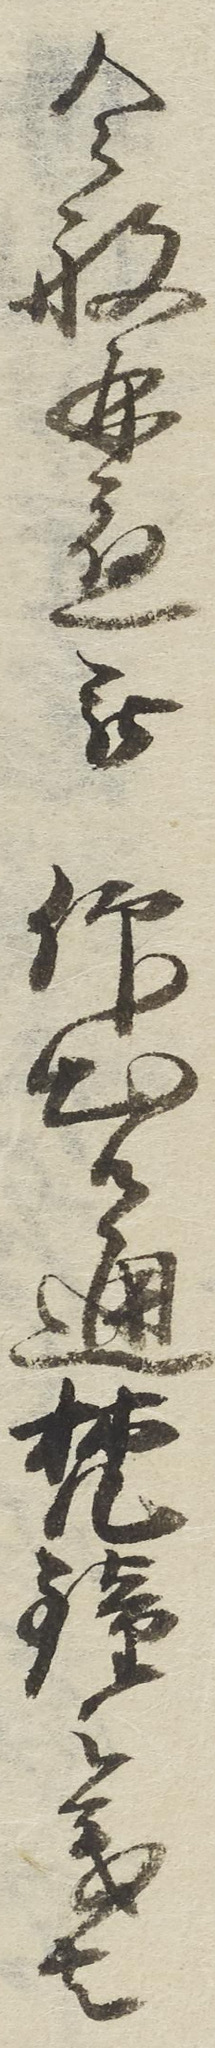今般再応被仰出候通梵鐘之義は

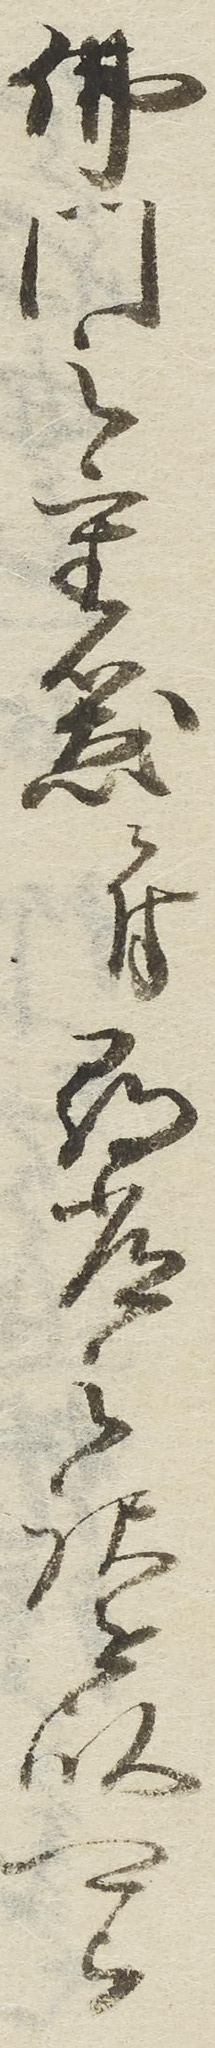仏門之重器二付尋常之訳を以可被
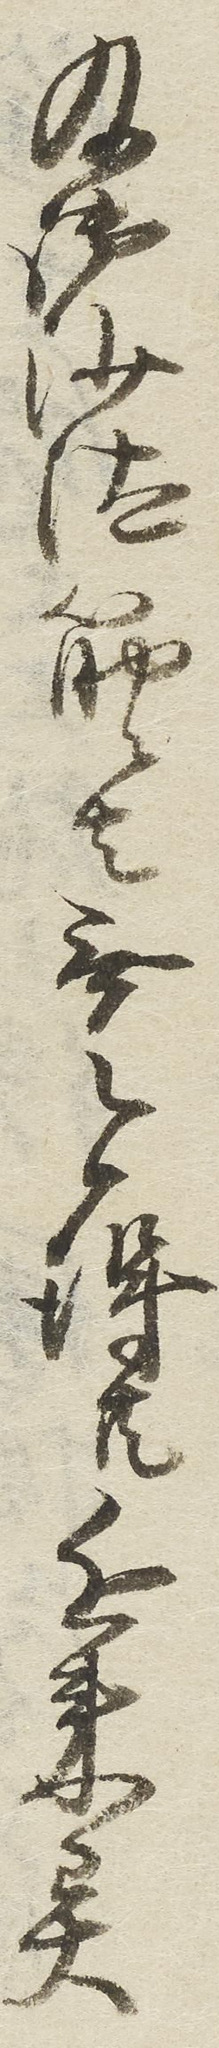及御沙汰筋二は無之候得共近来異
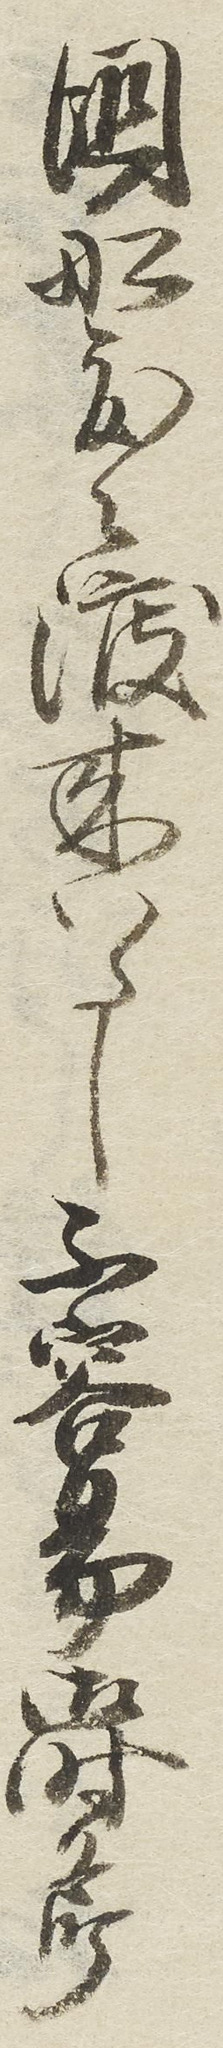国船度々渡来いたし不容意御時節
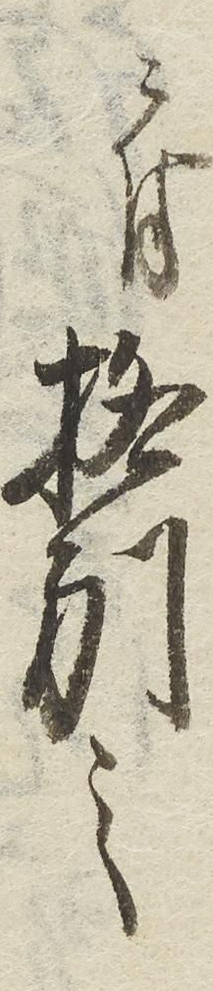二付格別之
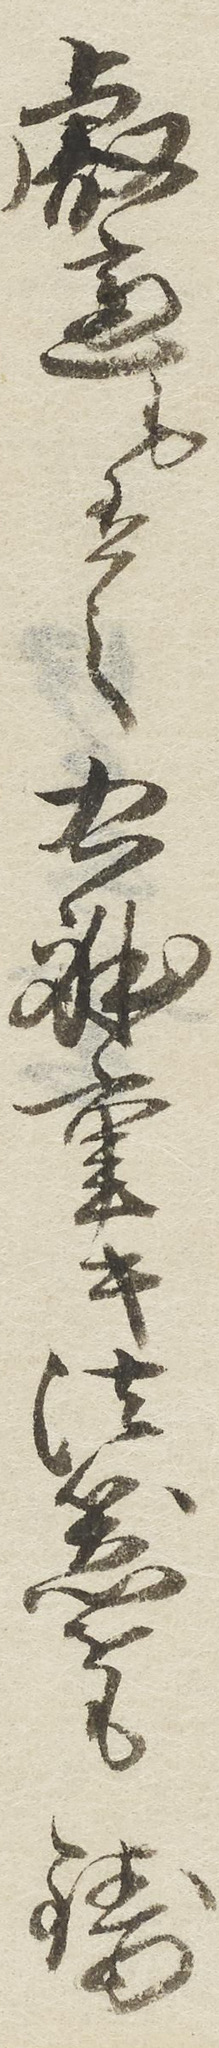叡慮も有之右体重キ法器をも鋳
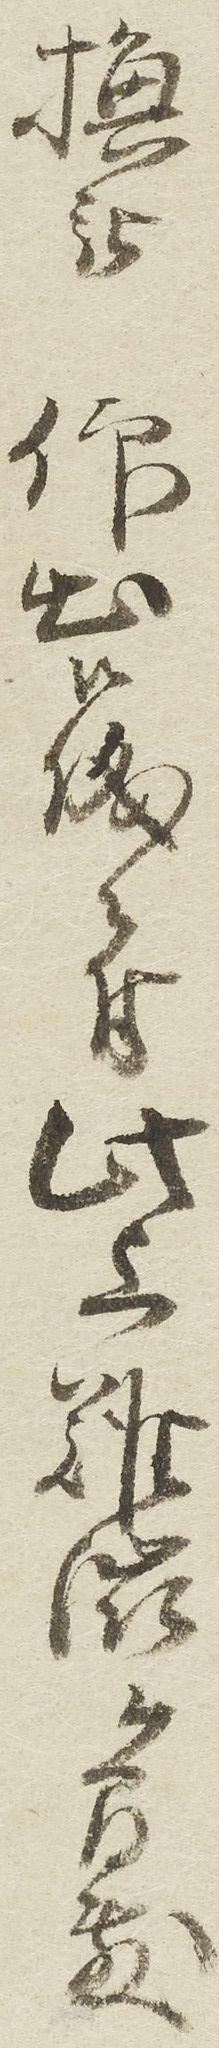換被仰出候儀二付此上難渋ヶ間敷
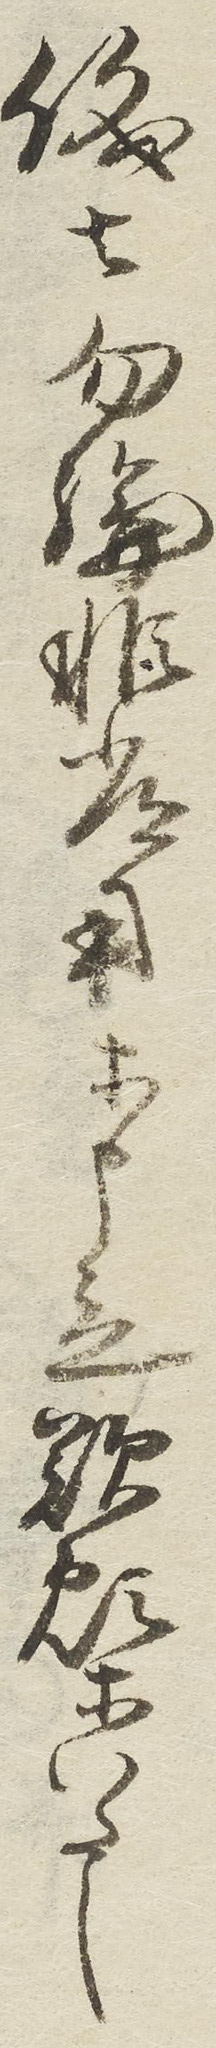儀は勿論非常用等申立歎願等いたし
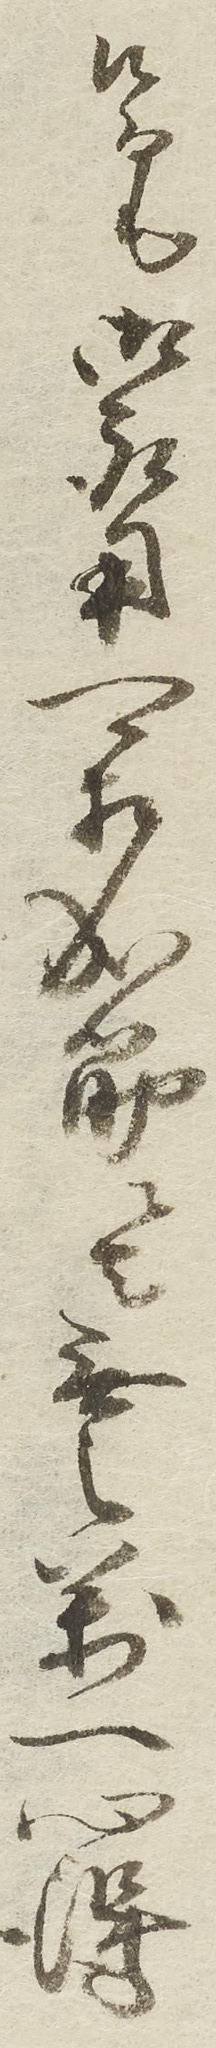候而も御取用可相成筋二は無之萬一心得
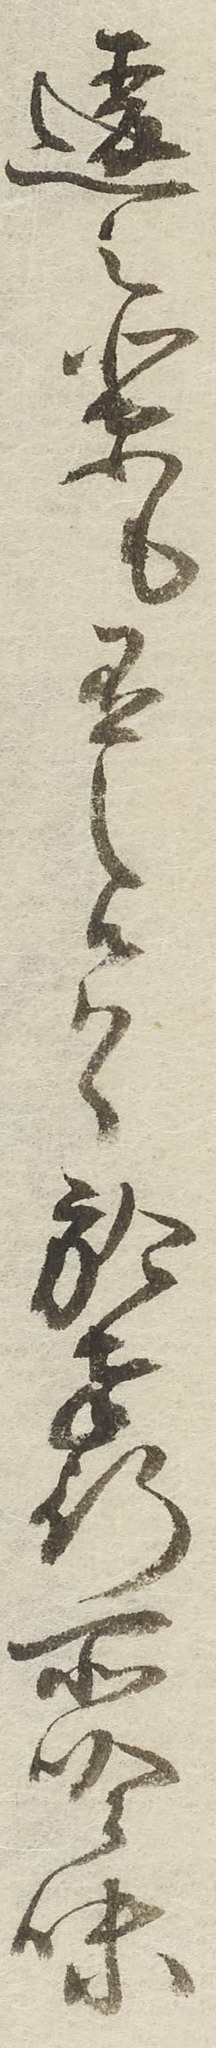違之輩も有之候ハゝ於奉行所吟味
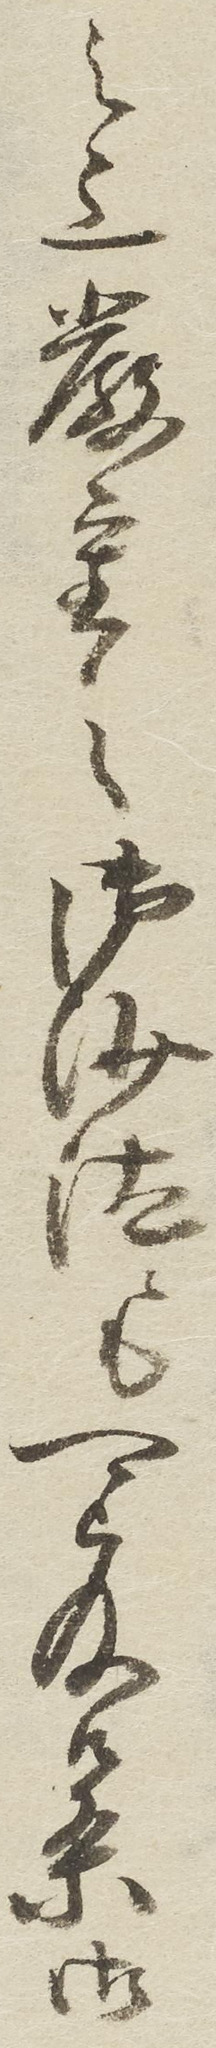之上厳重之御沙汰二も可被及候条御
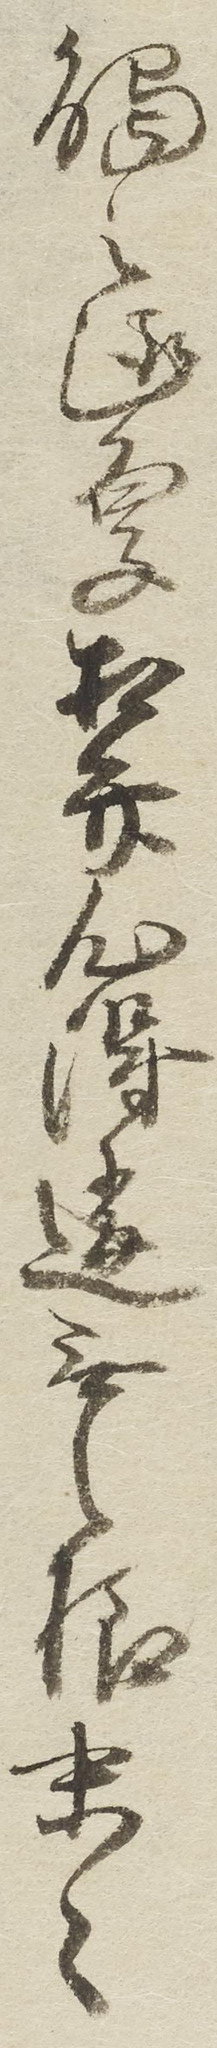觸之趣厚相弁心得違無之様未々
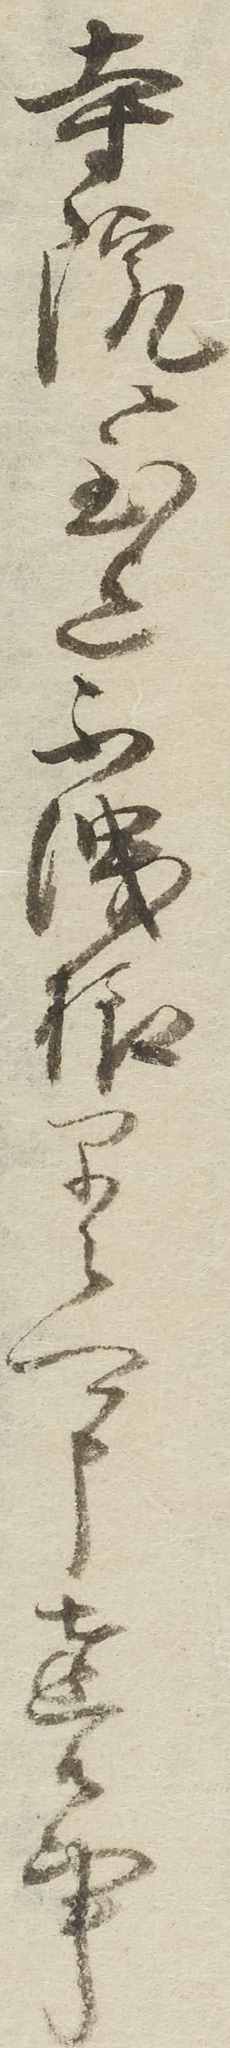寺院二至迄不洩様早々可申達候事

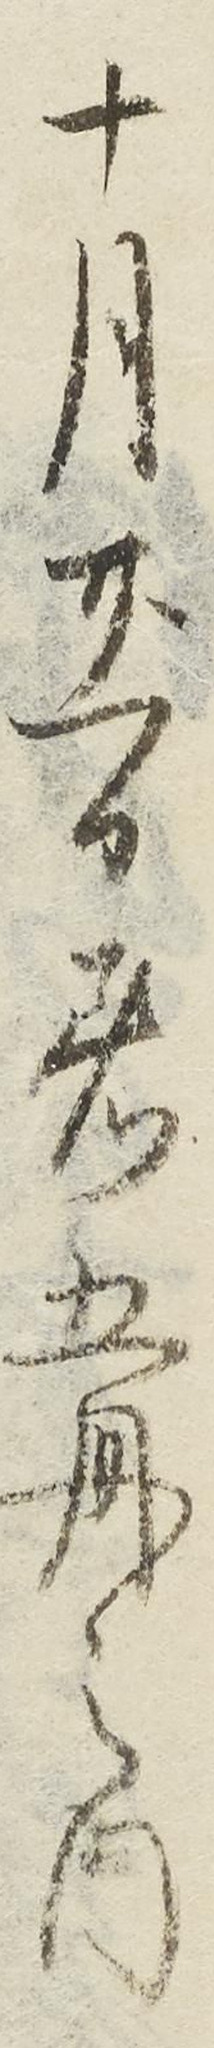十月廿一日着五冊の内
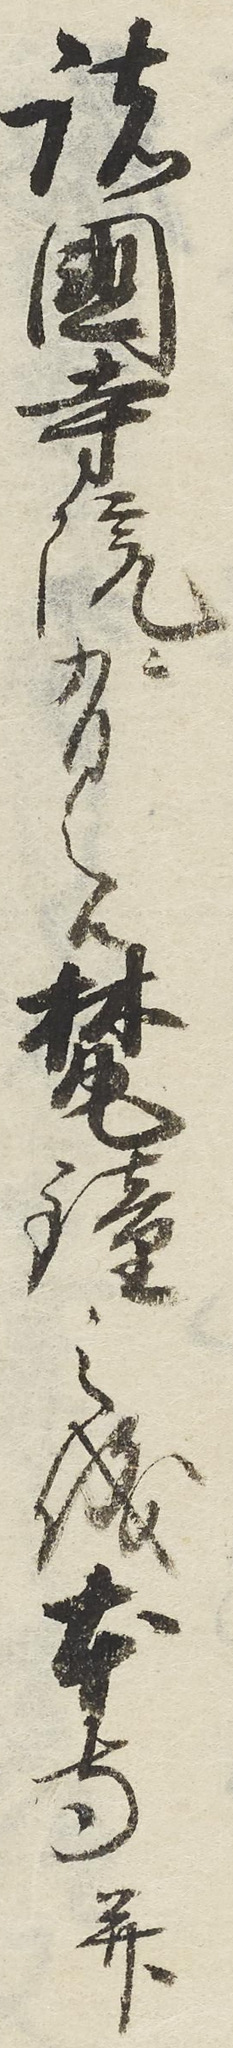諸国寺院二有之候梵鐘之儀本寺并
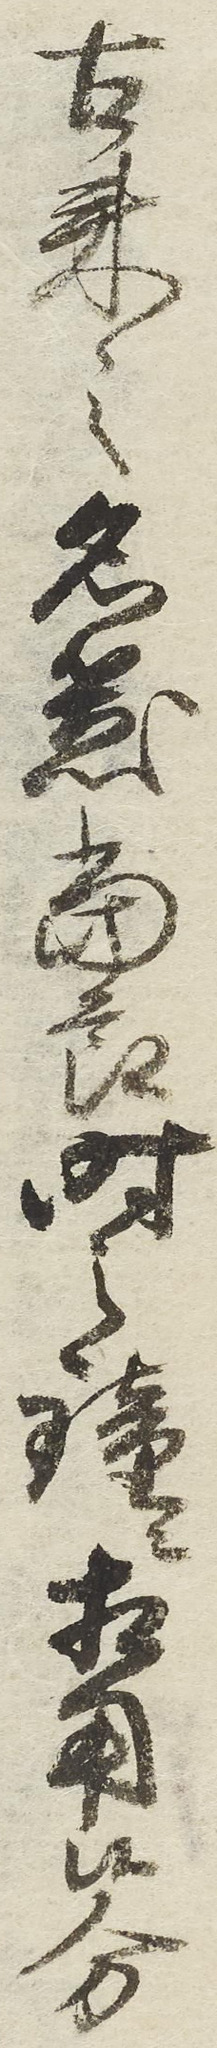古来之名器当節時之鐘二相用候分
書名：[梵鐘差出一件]
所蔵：東京大学地震研究所図書室 Earthquake Research Institute Library, The University of Tokyo, JAPAN
